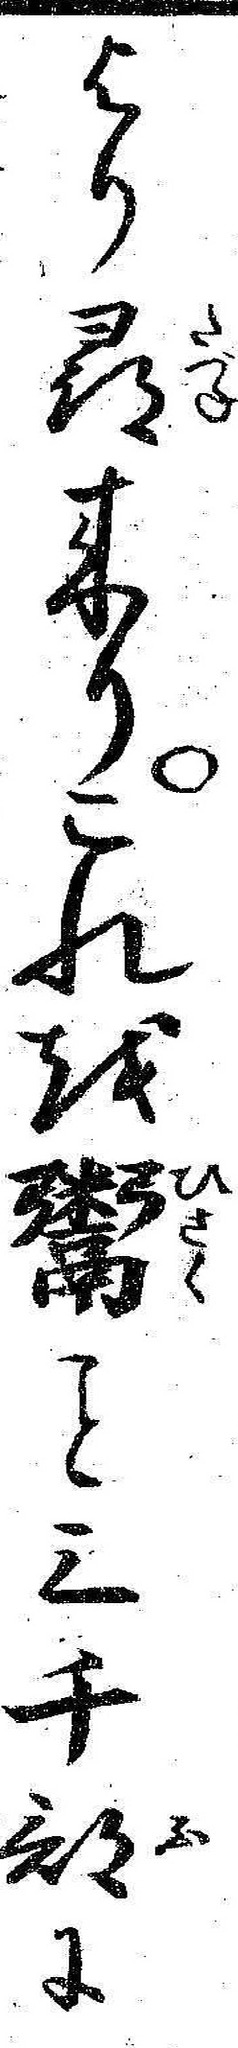より尋来り。これを鬻こと三千部に
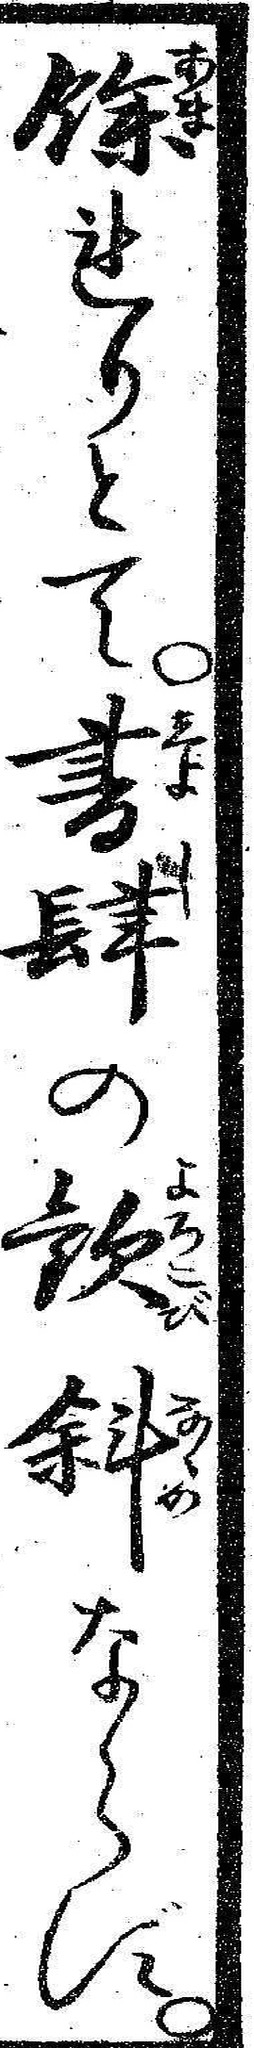余れりとて。書肆の歓斜ならず。
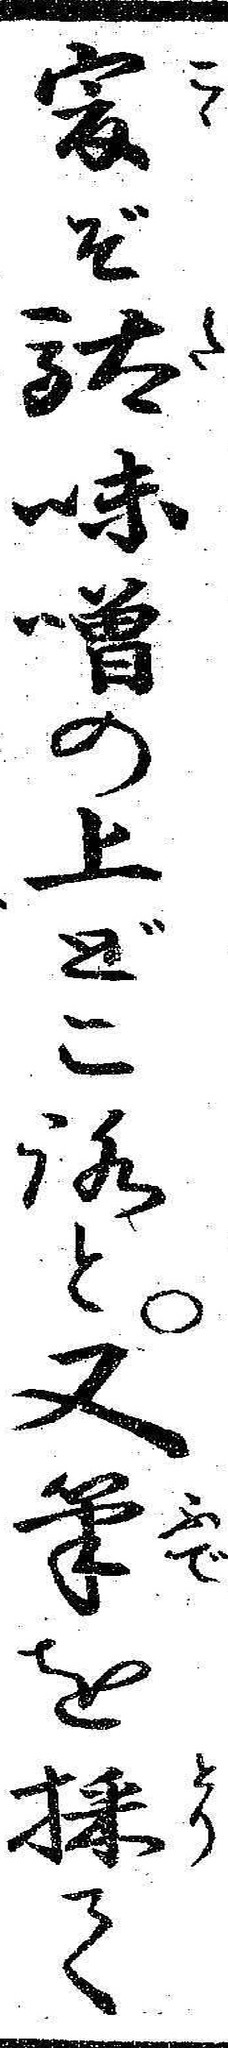爰ぞ駄味噌の上どころと。又筆を採て
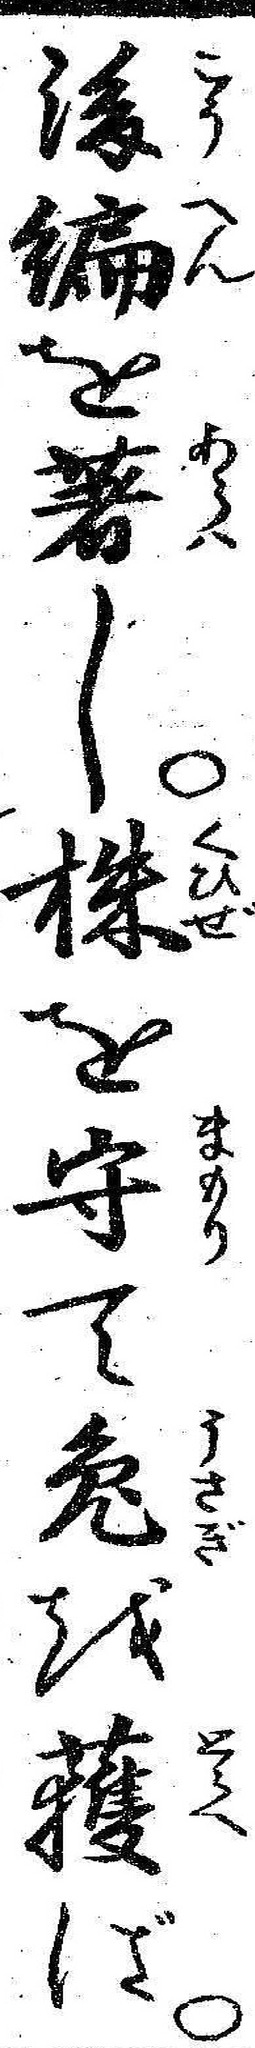後編を著し。株を守て兎を獲ば。
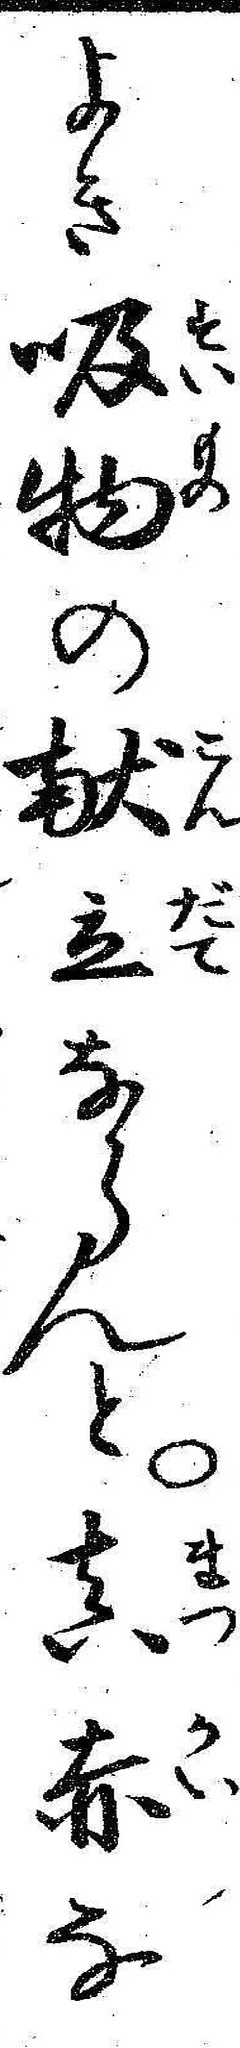よき吸物の献立ならんと。真赤な
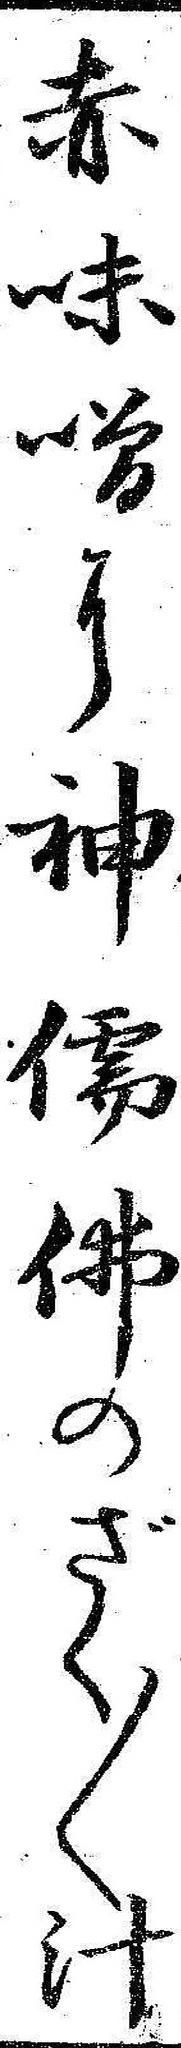赤味噌に神儒仏のざく〳〵汁。
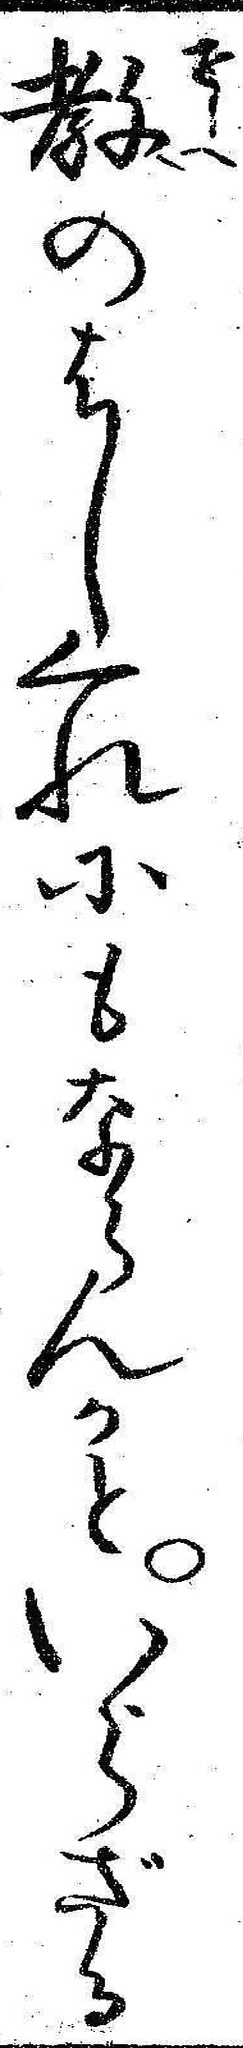教のはしくれにもならんかと。いらざる
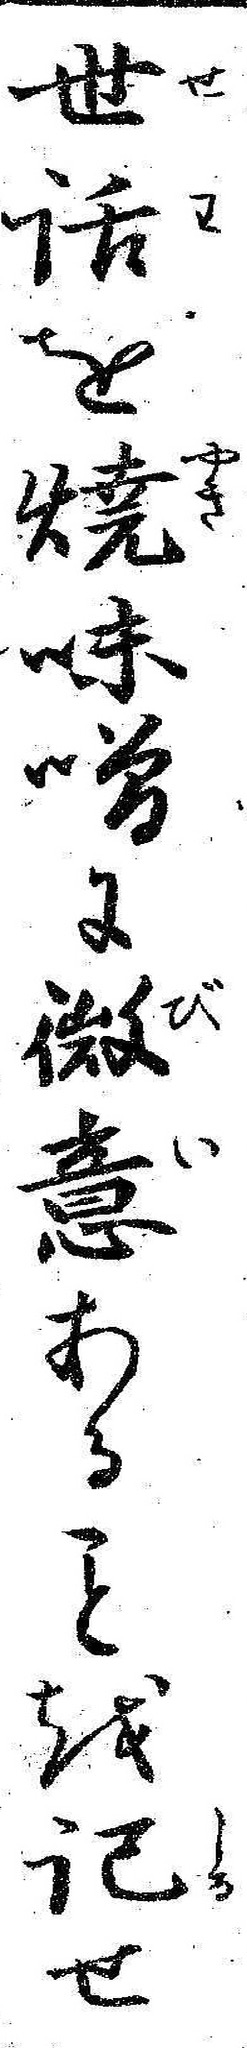世話を焼味噌に微意あることを記せ
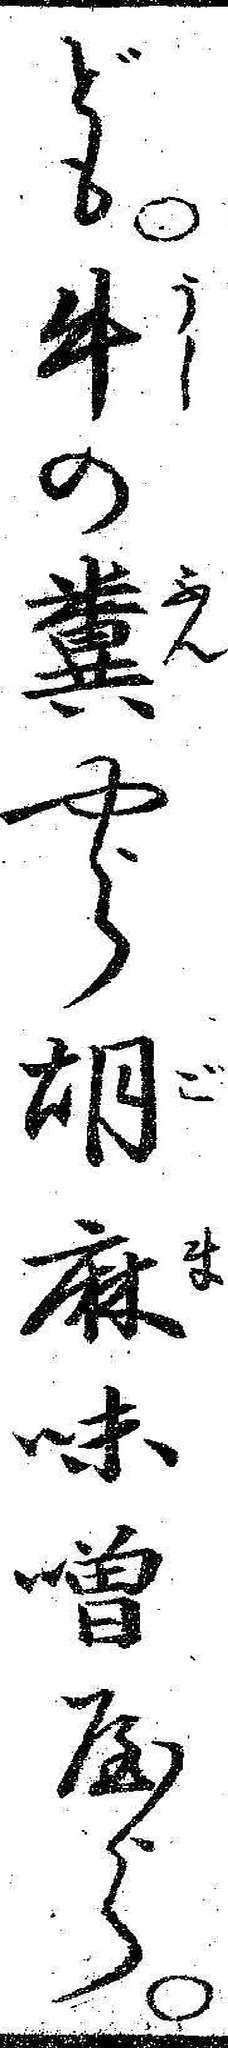ども。牛の糞やら胡麻味噌やら。

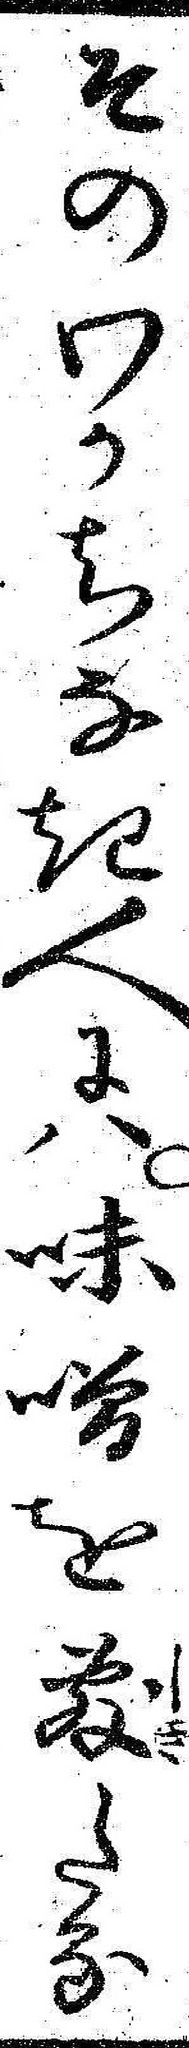そのわかちなき人には。味噌を敷たる
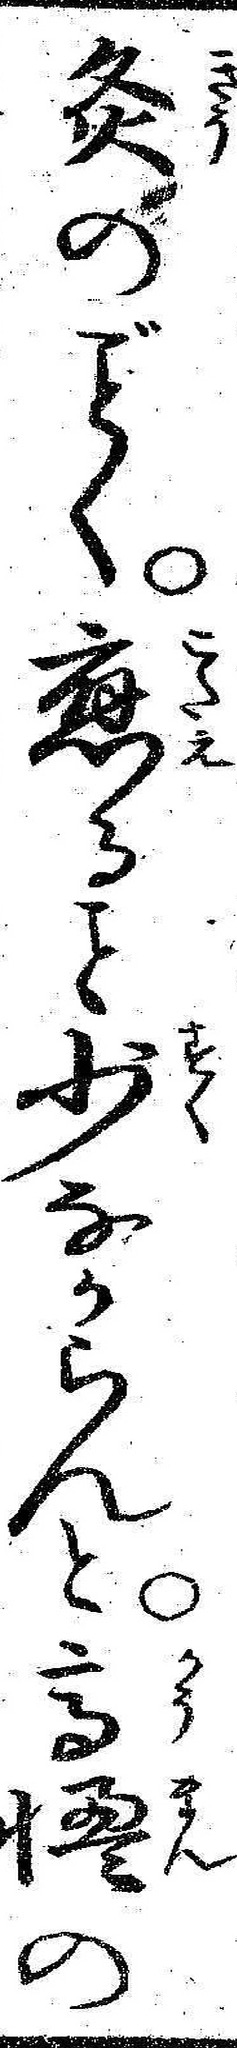灸のごとく。応ること少なからんと。高慢の
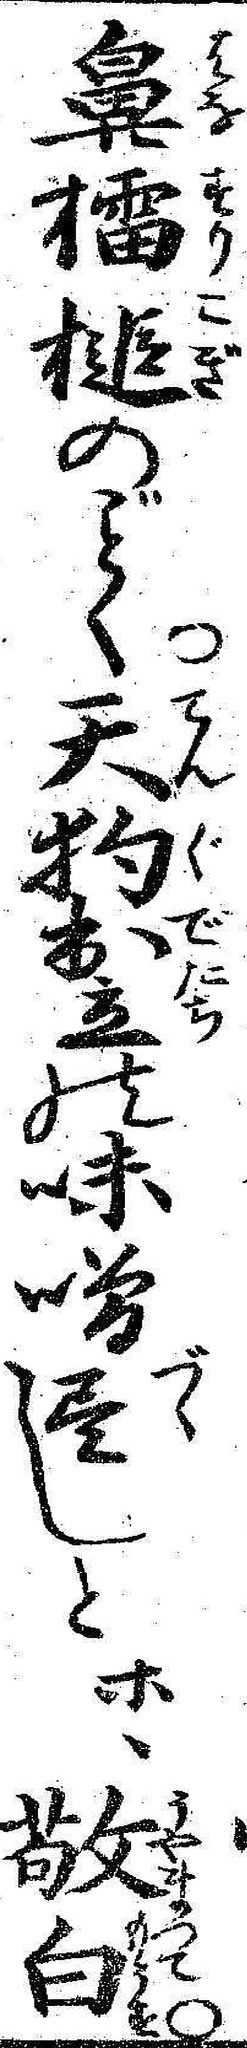鼻檑槌のごとく。天狗出立の味噌尽しとホヽ敬白。
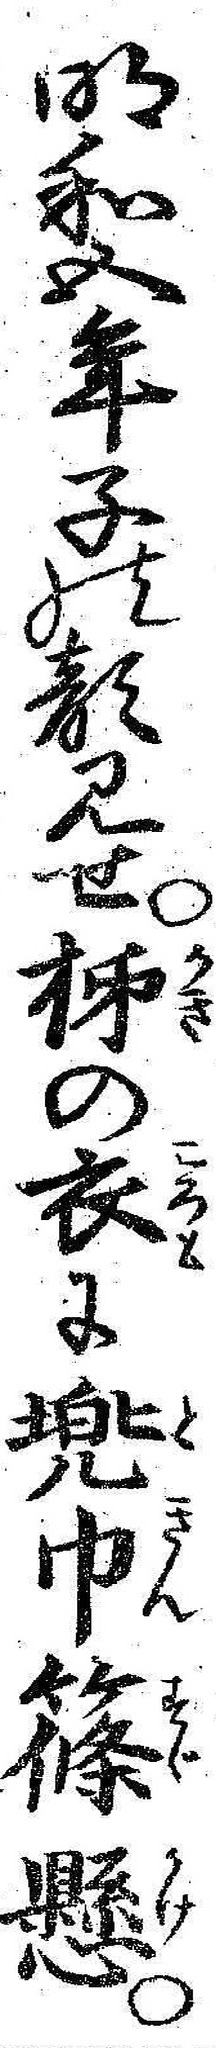明和五年子の顔見世。柿の衣に兜巾篠懸。
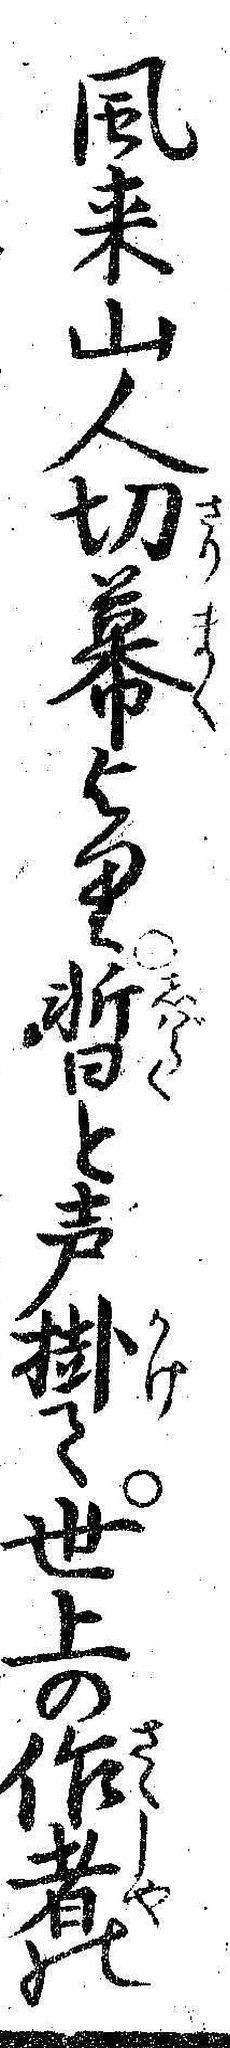風来山人切幕より。暫と声掛て。世上の作者の
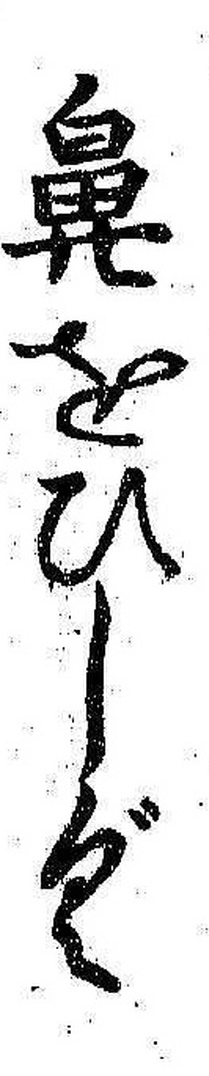鼻をひしぐ
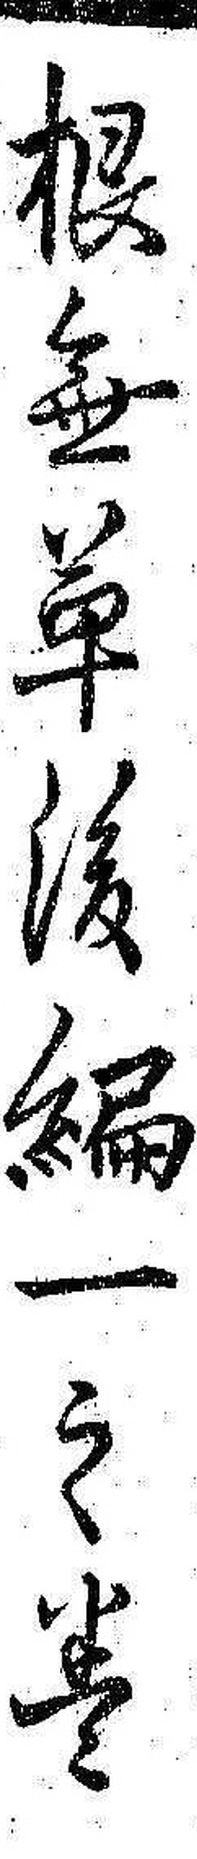根無草後編一之巻
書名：根無草後編
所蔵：国文学研究資料館
